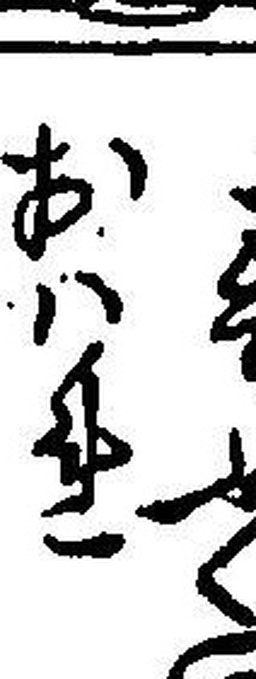おはれ
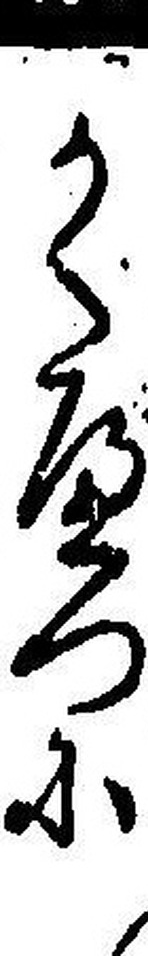かくべつに
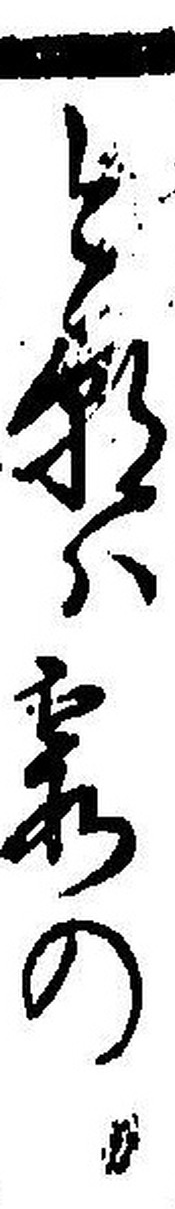今朝は霞の
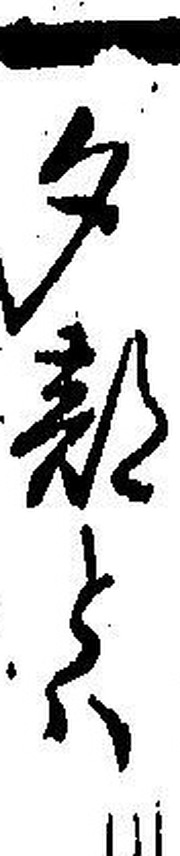夕へとは
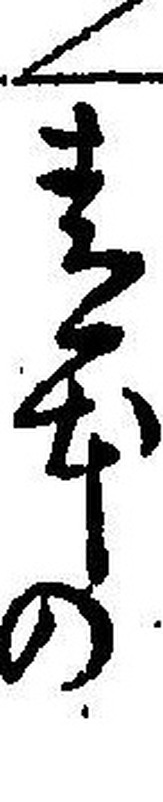青本の
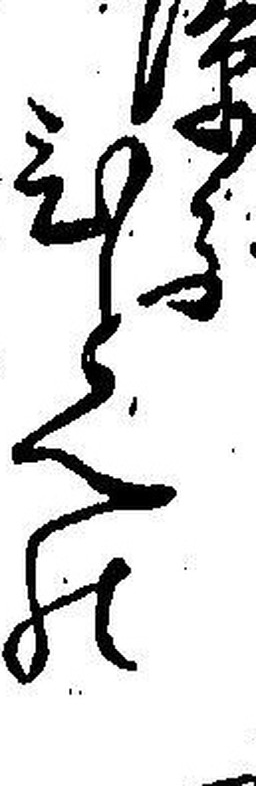ひとへの
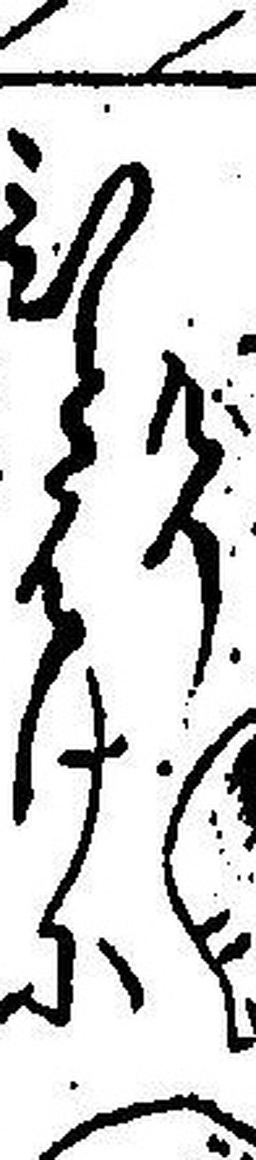ひとはけに
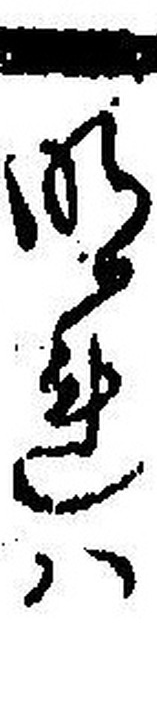明れは
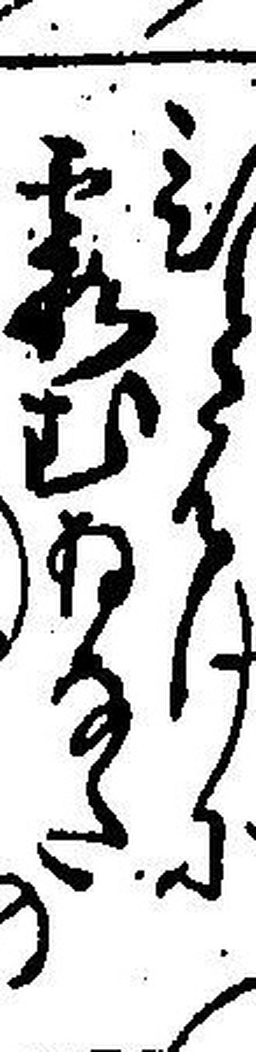霞むあなたの
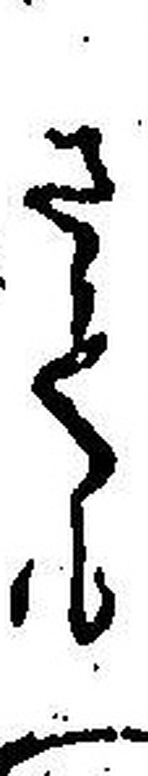さても
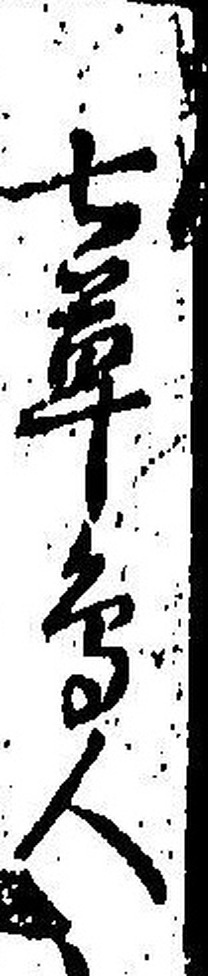七草鳥人
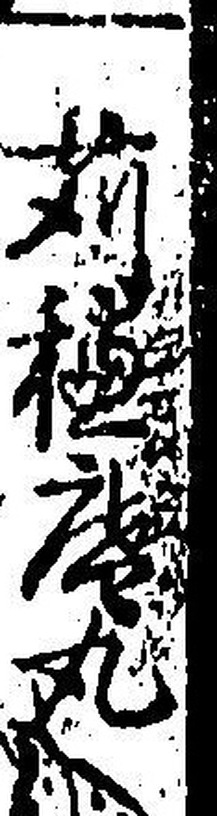苅穂庵丸
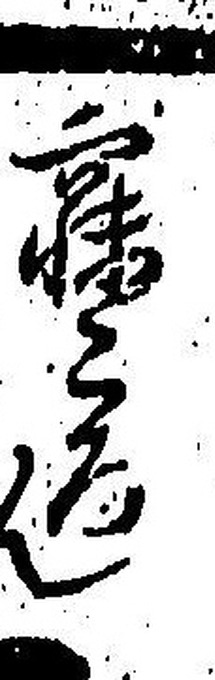寝ころ
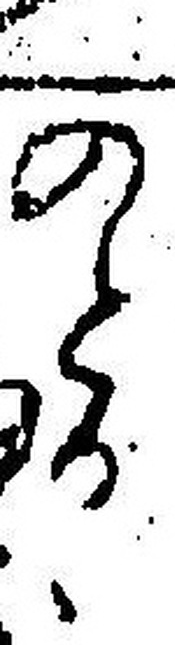のとか
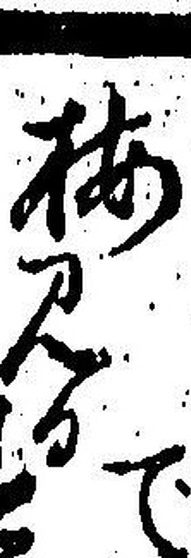梅見る
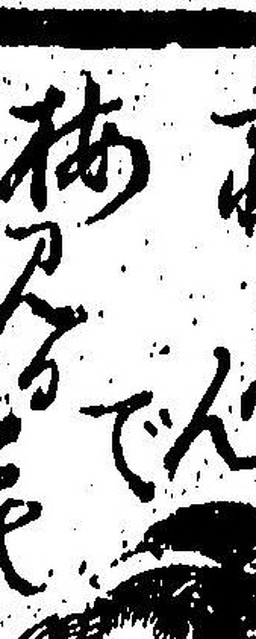梅見る
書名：どうれ百人一首 / 鹿都部真顔(狂歌堂)編
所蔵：東京大学総合図書館 General Library in the University of Tokyo, JAPAN
